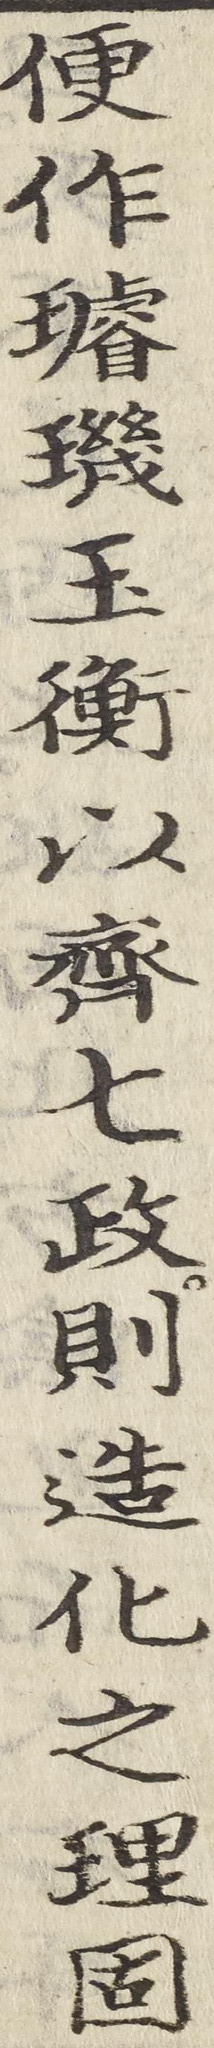便作璿璣玉衡以齋七政。則造化之理固
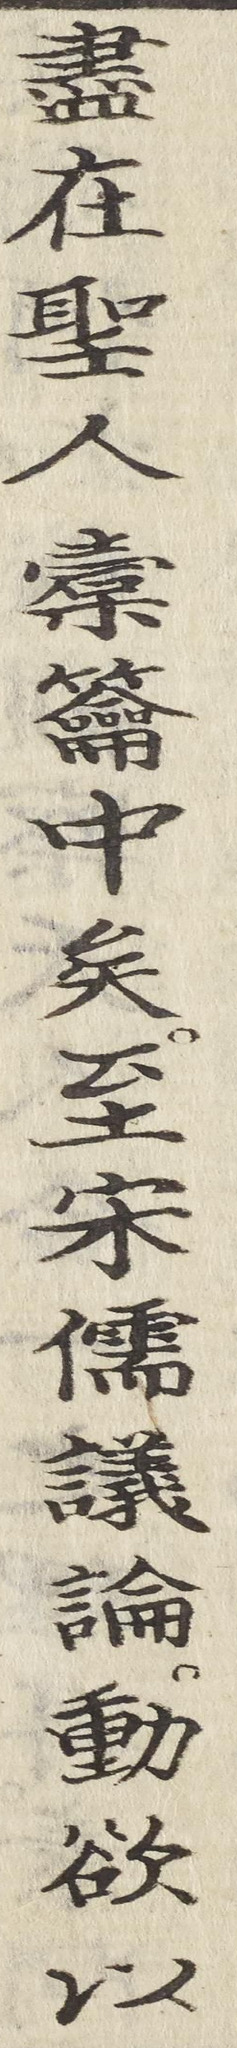尽在聖人槖籥中矣。至宋儒議論。動欲以
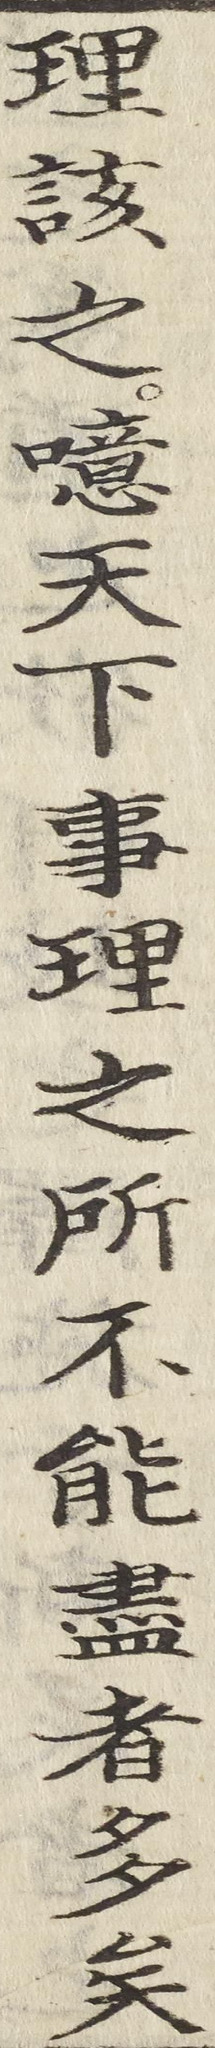理該之。噫天下事理之所不能尽者多矣。
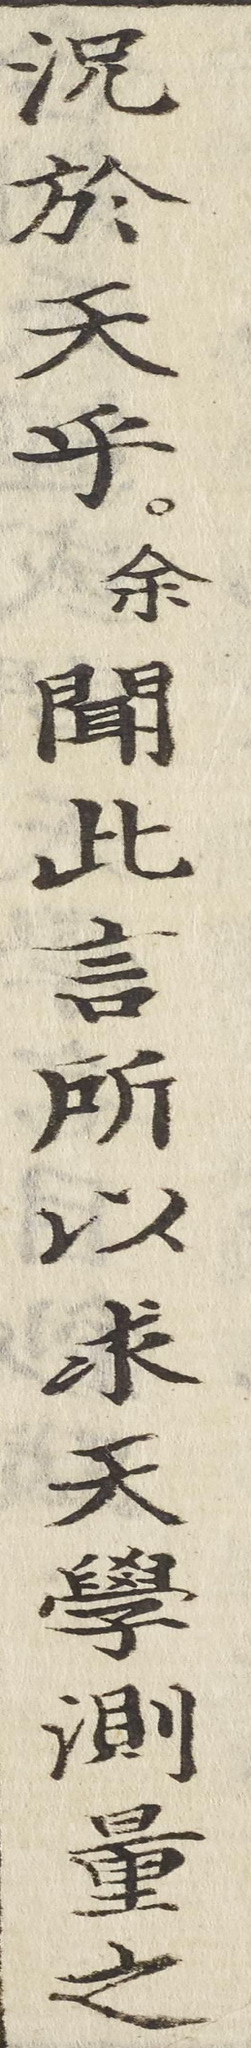況於天乎。余聞此言所以求天学測量之
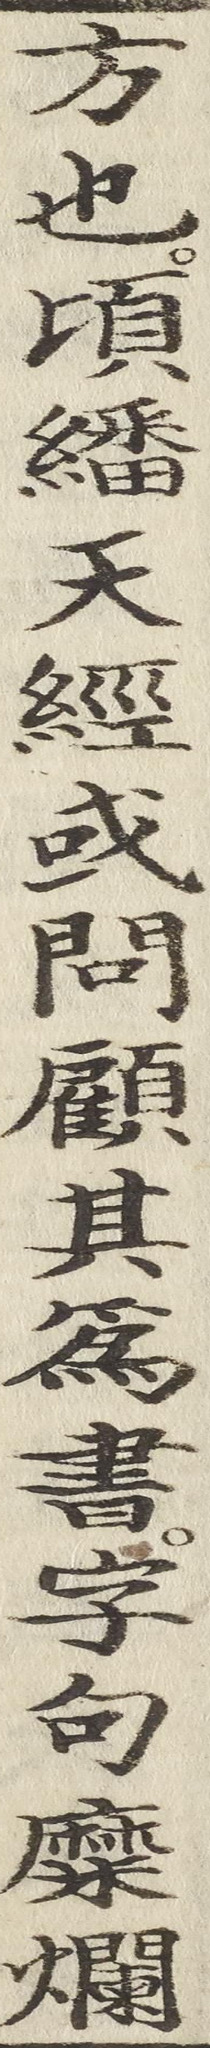方也。頃繙天経或問顧其為書。字句糜爛
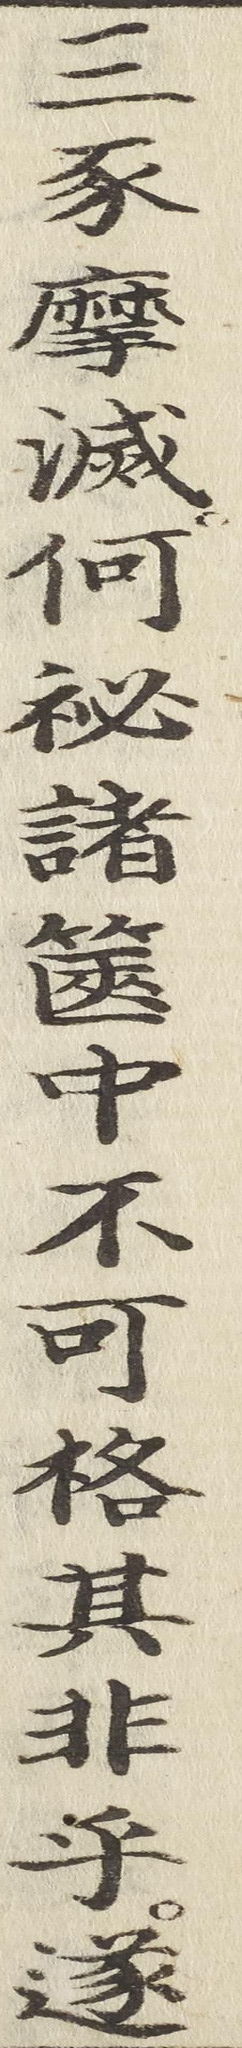三豕摩滅。何秘諸篋中不可格其非乎。遂
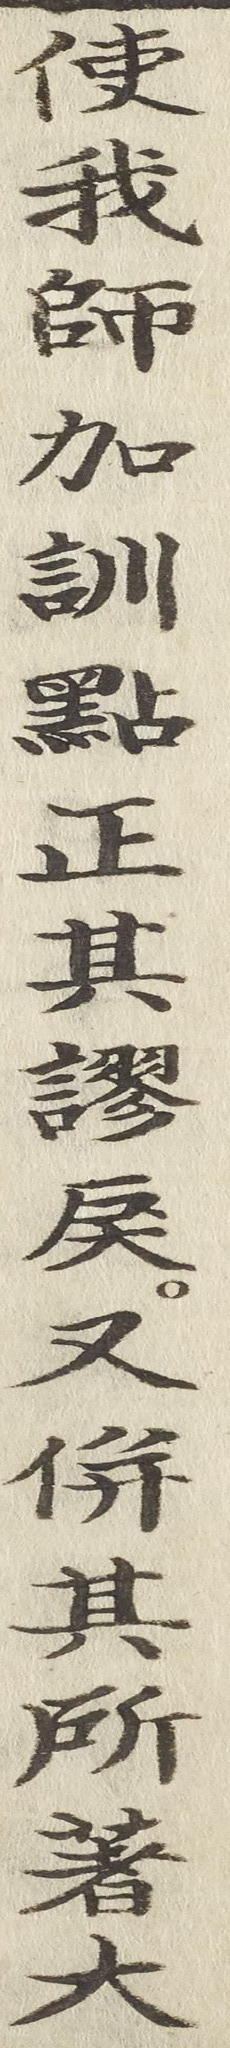使我師加訓点正其謬戻。又併其所著大
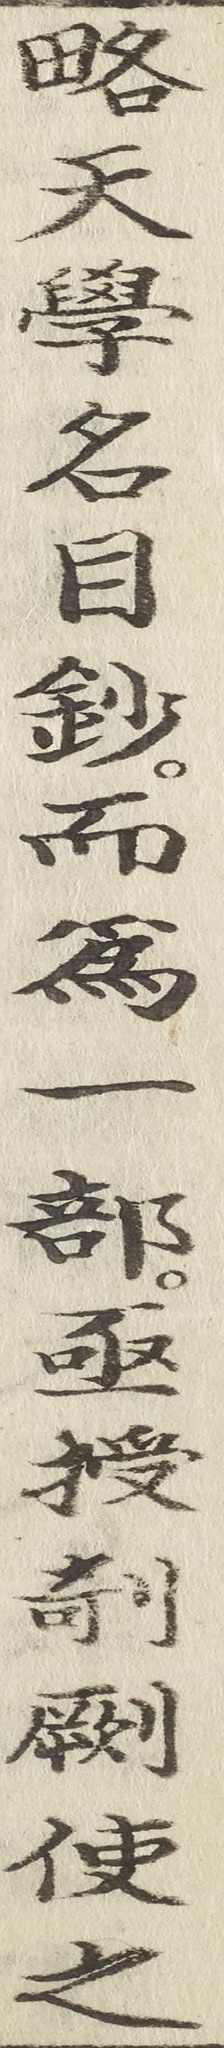略天学名目鈔。而為一部。亟剞劂使之
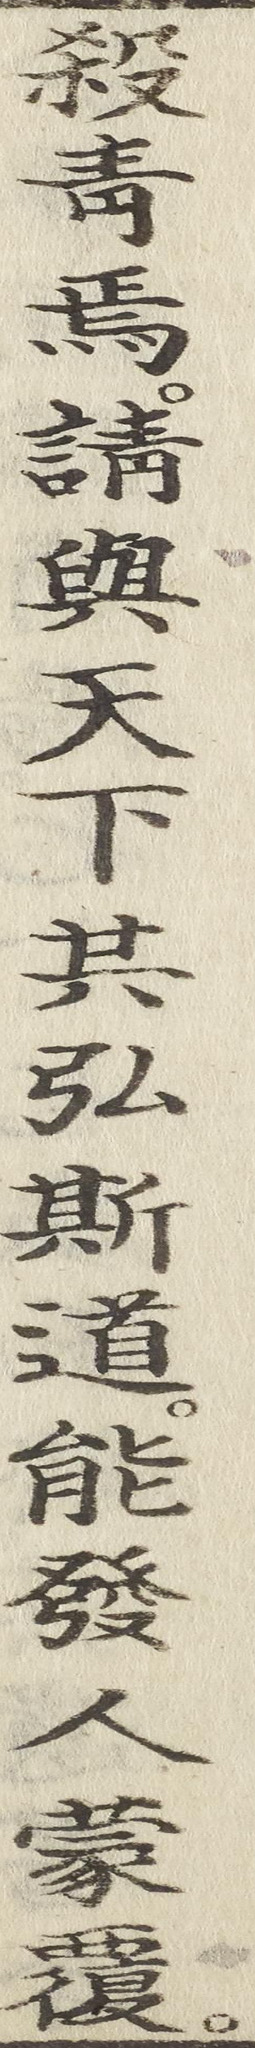殺青焉。請与天下其弘斯道。能発人蒙覆。
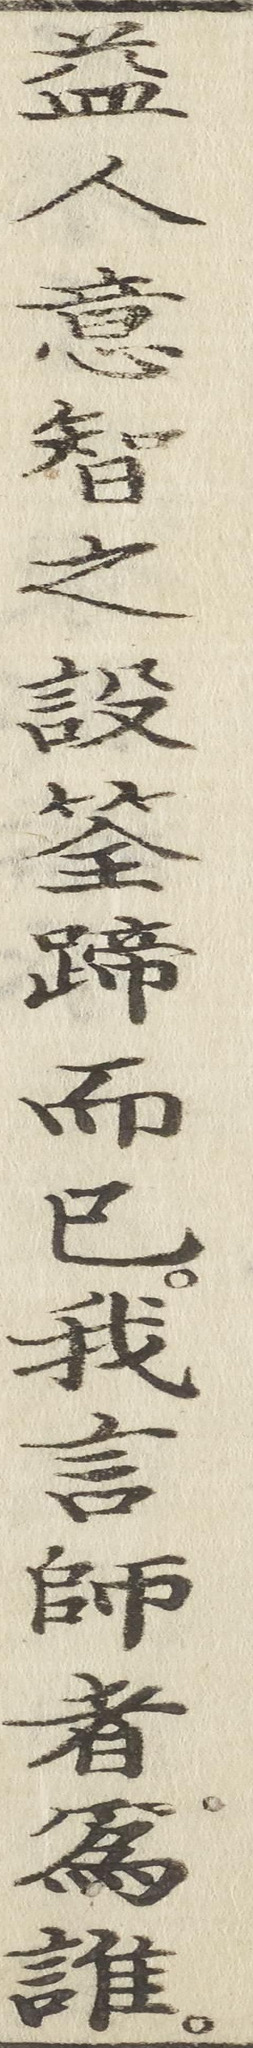益人意智之設筌蹄而已。我言師者為誰。
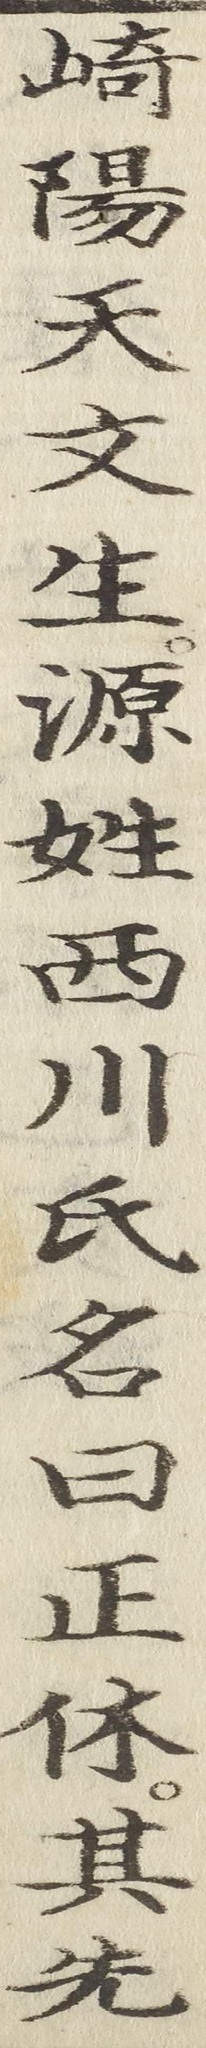崎陽天文生。源姓西川氏名曰正休。其先
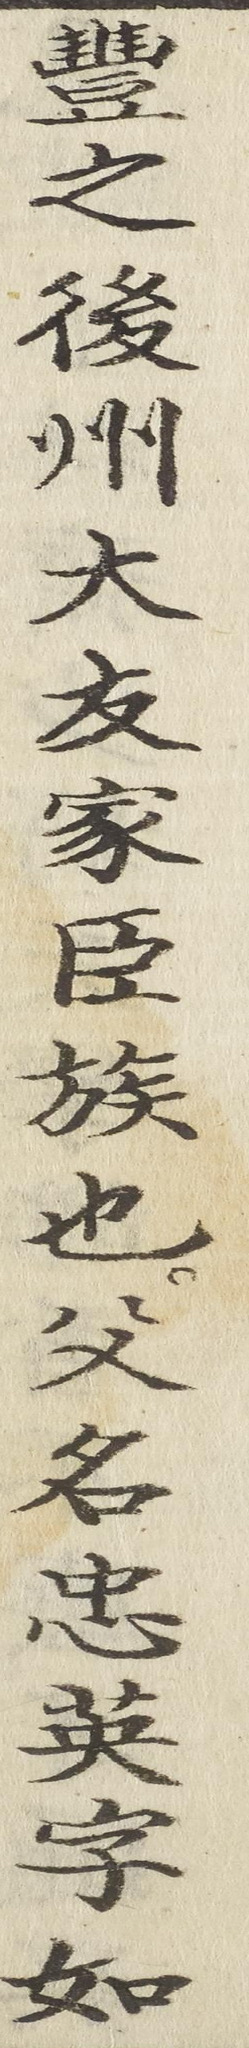豊之後州大友家臣族也。父名忠英字如

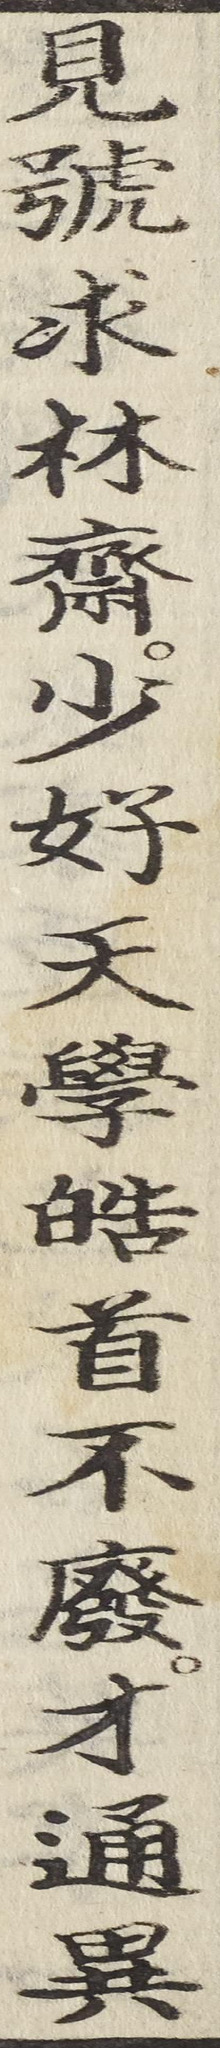見号求林齋。少好天学皓首不廃。才通異
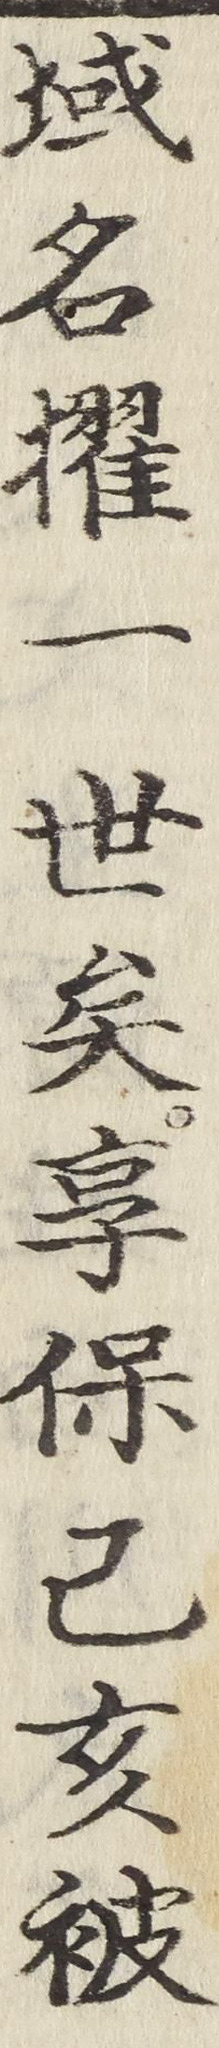域名懼一世矣。享保己亥被
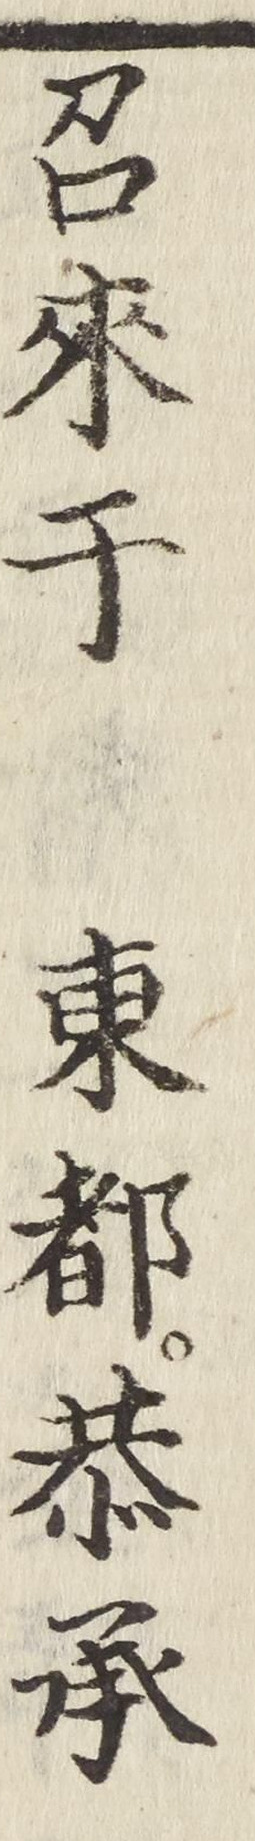召来于東都。恭承
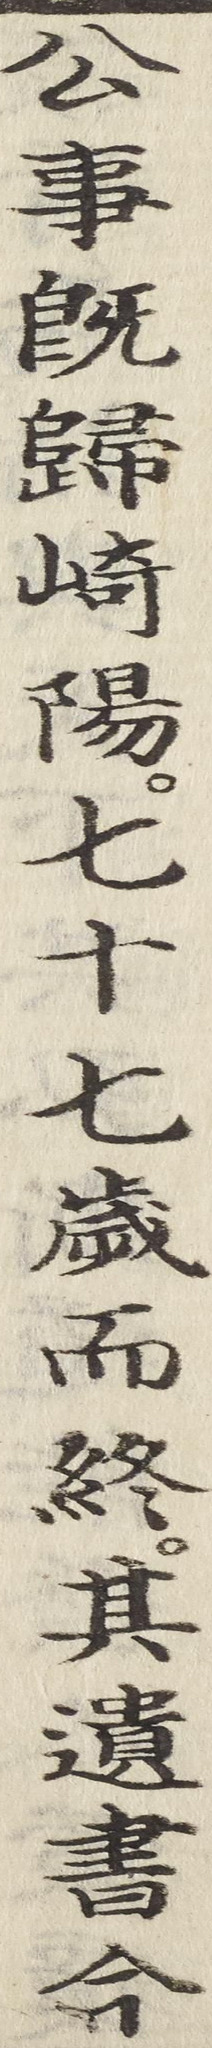公事既帰崎陽。七十七歳而終。其遺書今
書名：天經或問　地
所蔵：東京大学地震研究所図書室 Earthquake Research Institute Library, The University of Tokyo, JAPAN
